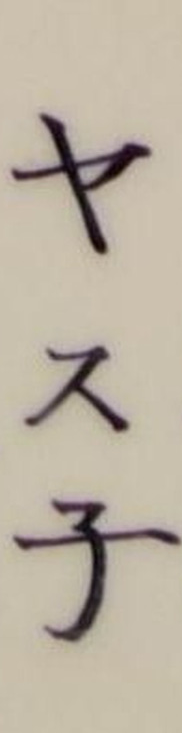ヤス子
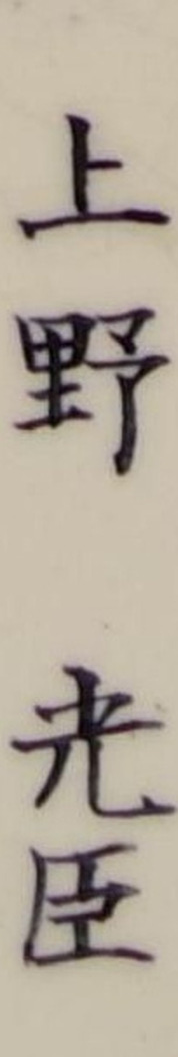上野光臣
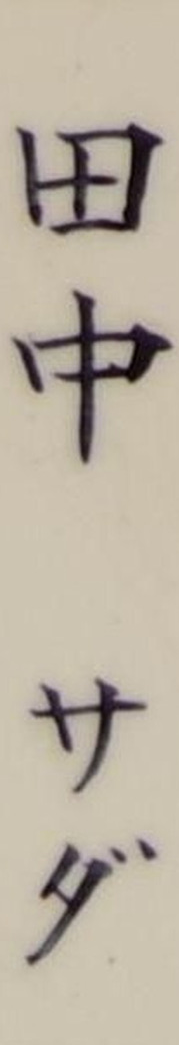田中サダ
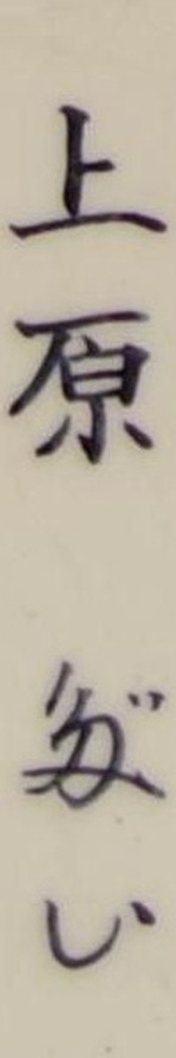上原だい
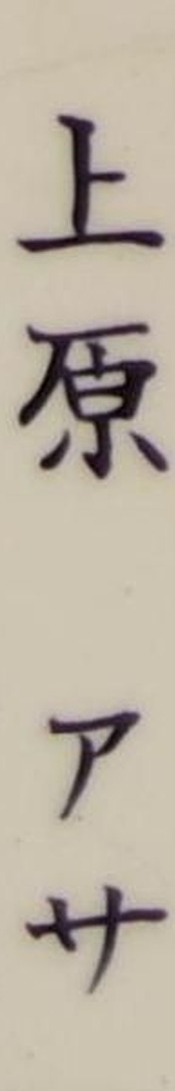上原アサ
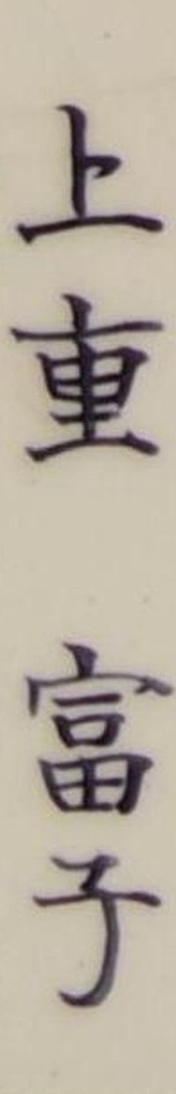上重富子
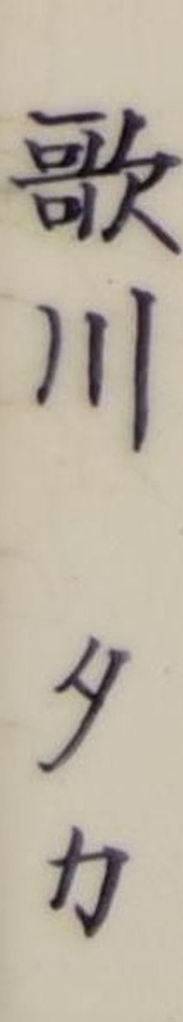歌川タカ

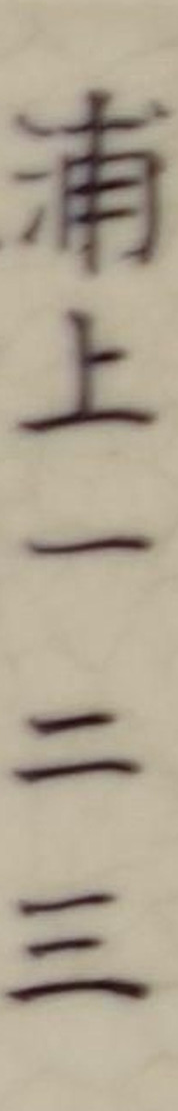浦上一二三
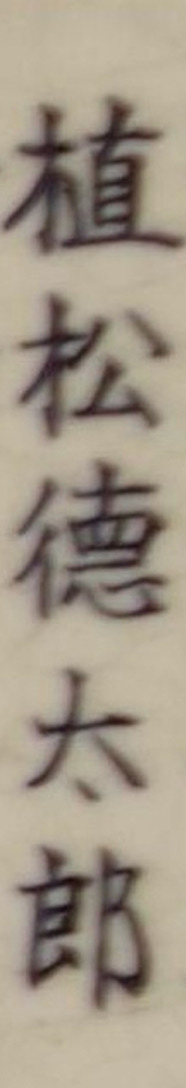植松徳太郎
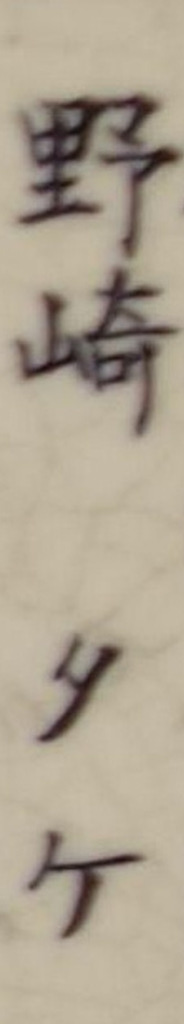野崎夕ケ
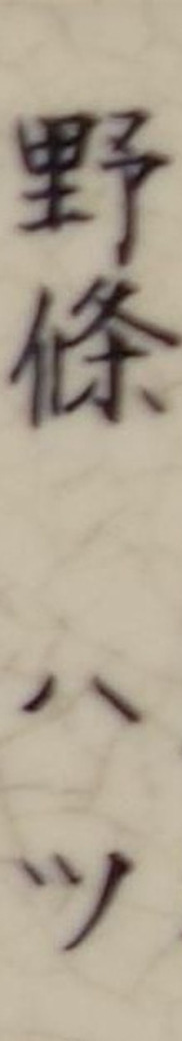野條ハツ
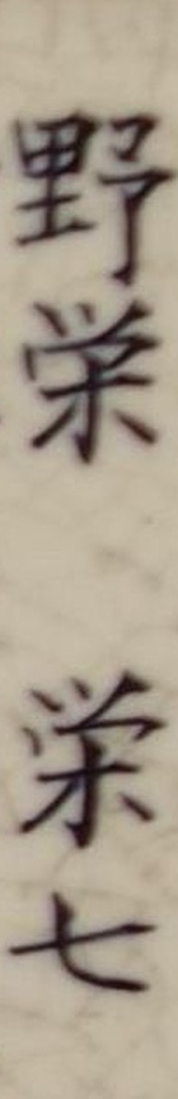野栄栄七
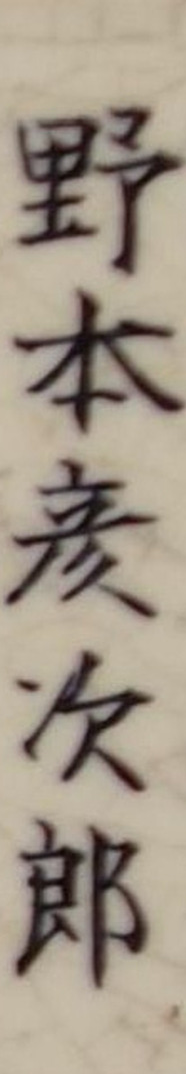野本彦次郎
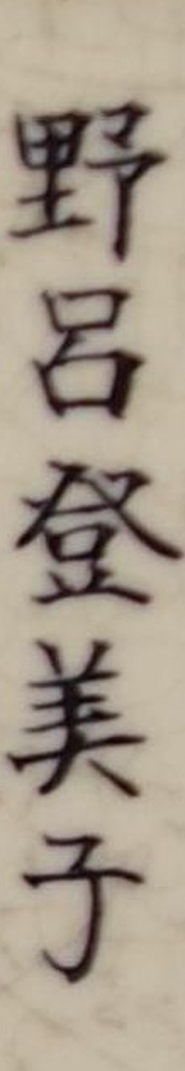野呂登美子
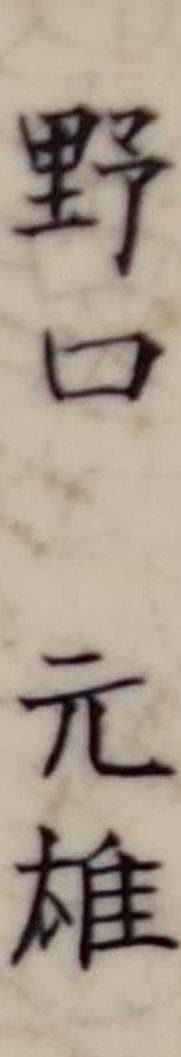野口元雄
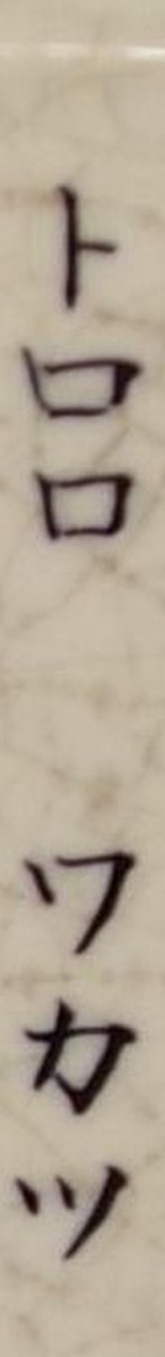トロロワカツ
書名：M~S
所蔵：高野山金剛峯寺
